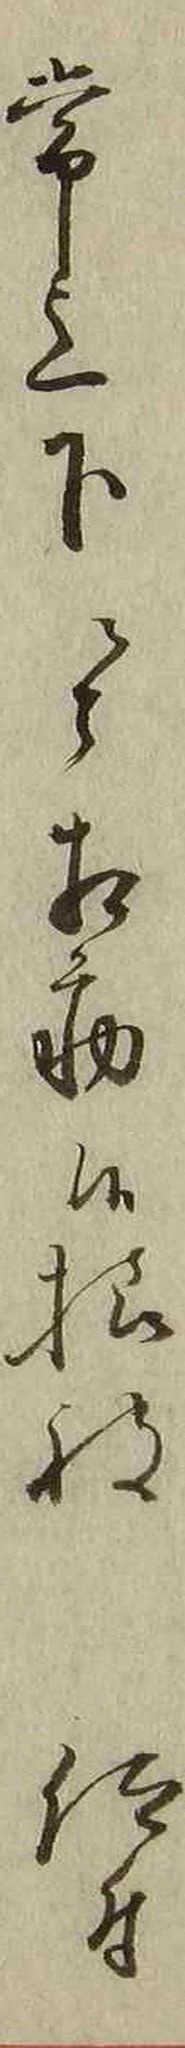常上下ニて相勤候様被仰付
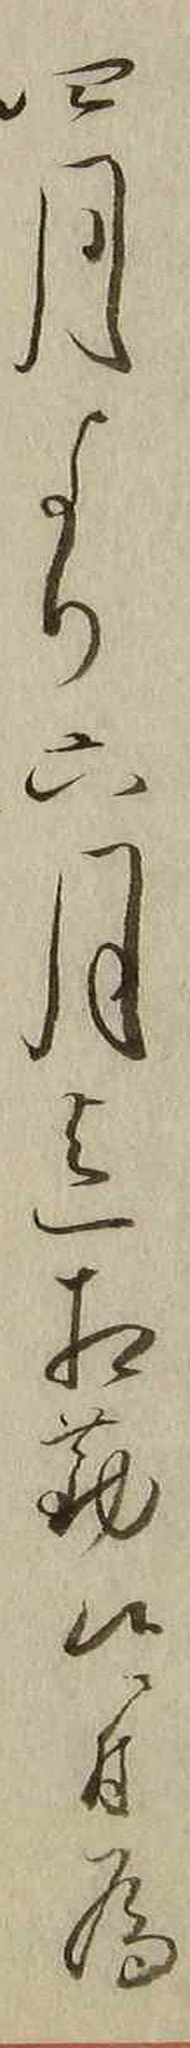四月より六月迄相勤候ニ付為
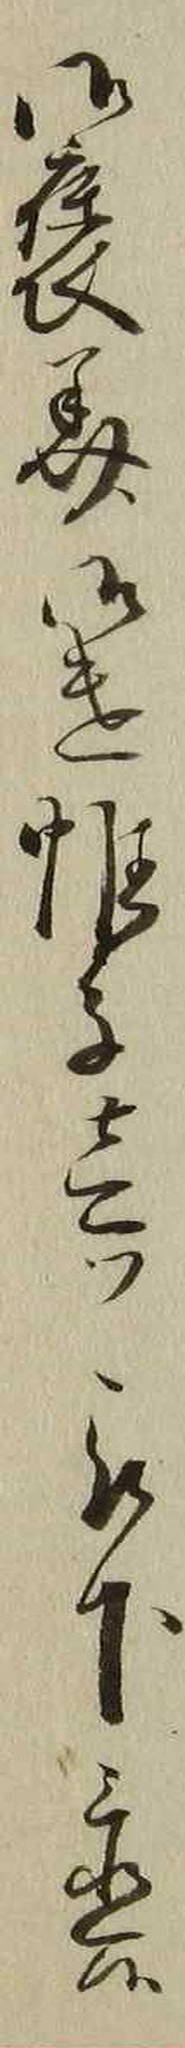御褒美御遣帷子壱ツ被下置候
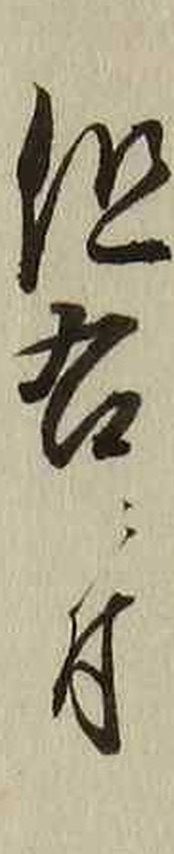但右ニ付
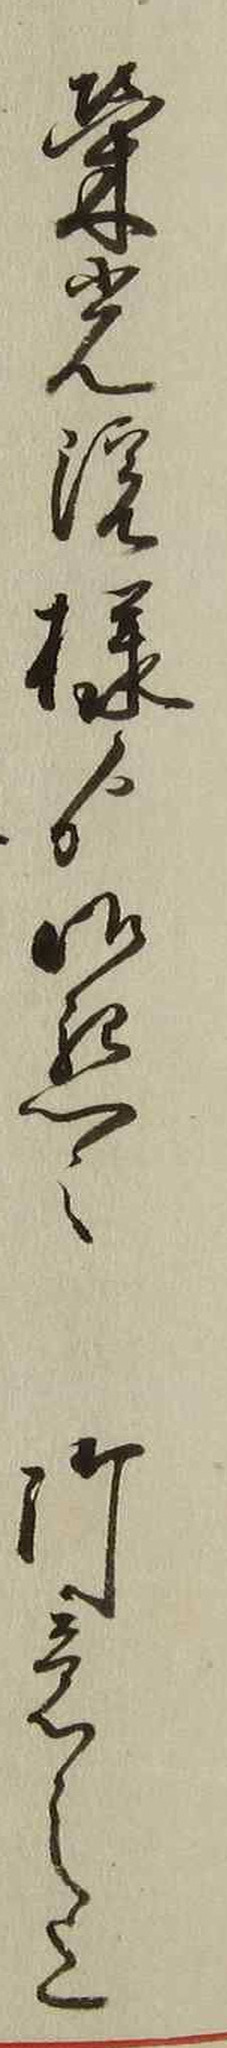栄光院様ゟ御懇之御意之上
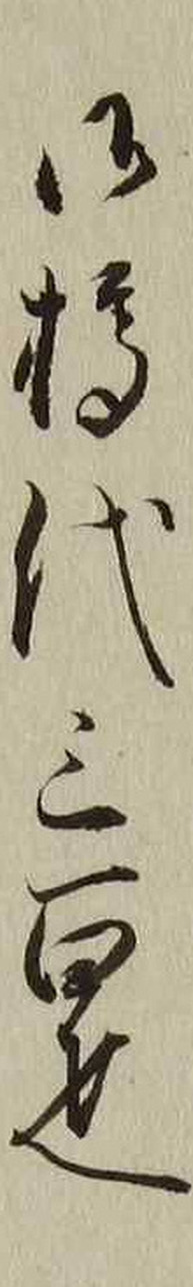御樽代三百疋
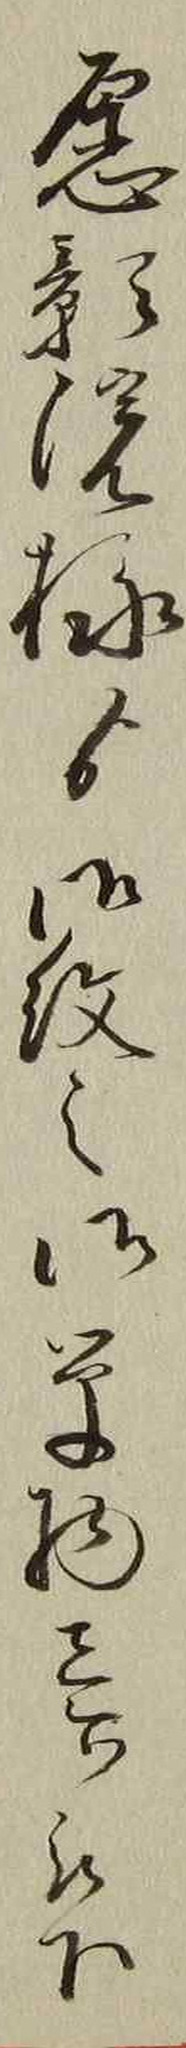愿彰院様ゟ御紋之御単物を壱ツ被下
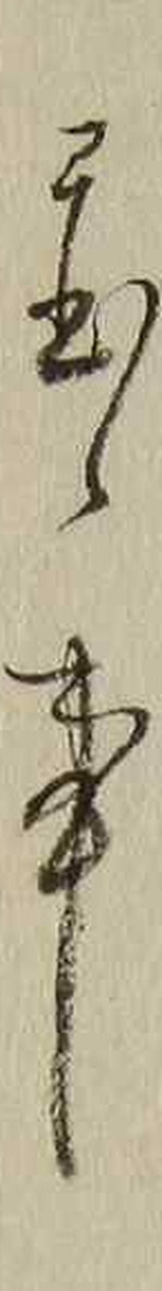置候事
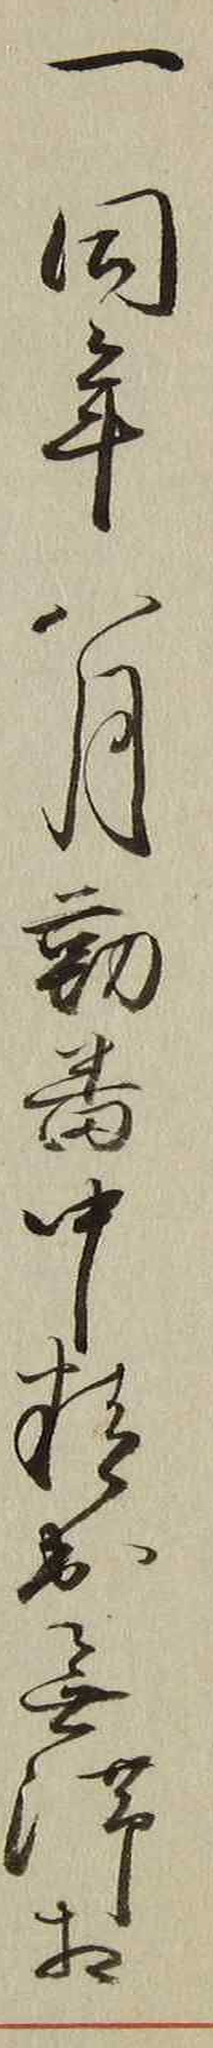一同年八月勤番中精出無滞相
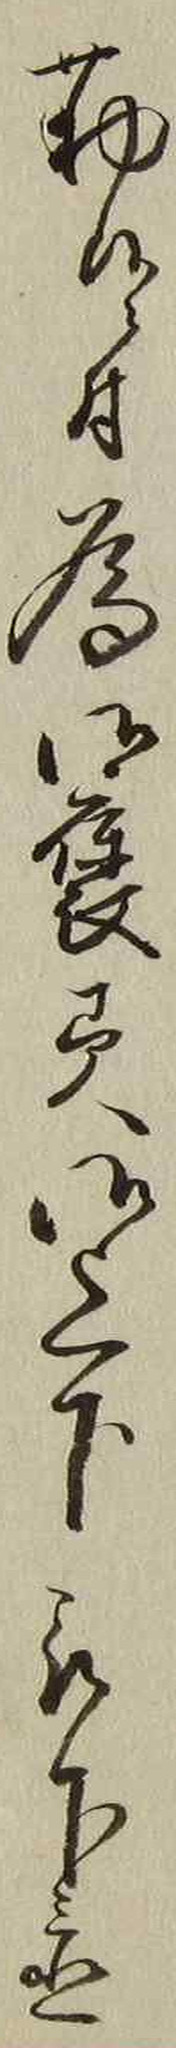勤候ニ付為御褒美御上下被下置
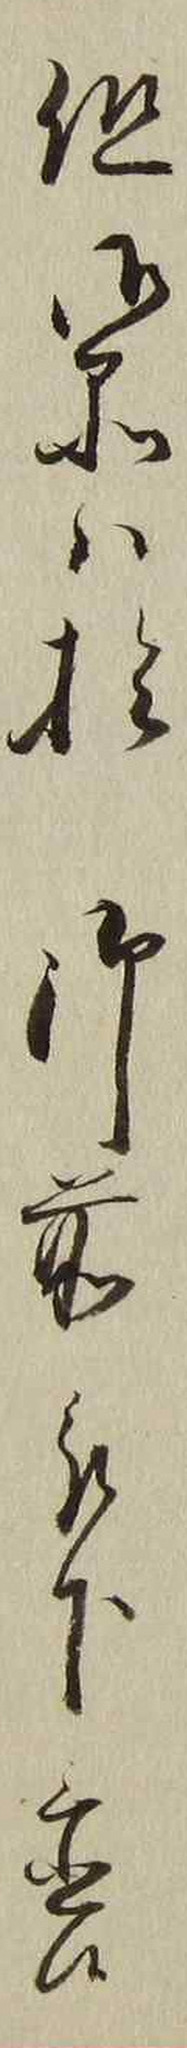但御品ハ於御前被下置候
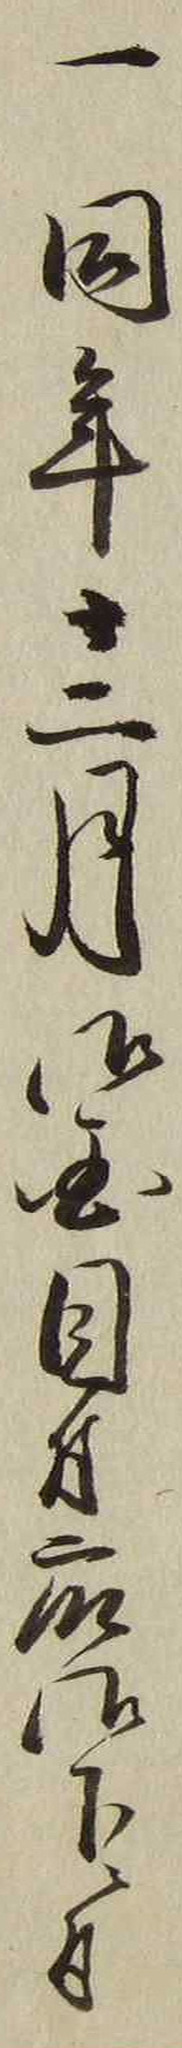一同年十二月御国目付衆御下ニ付

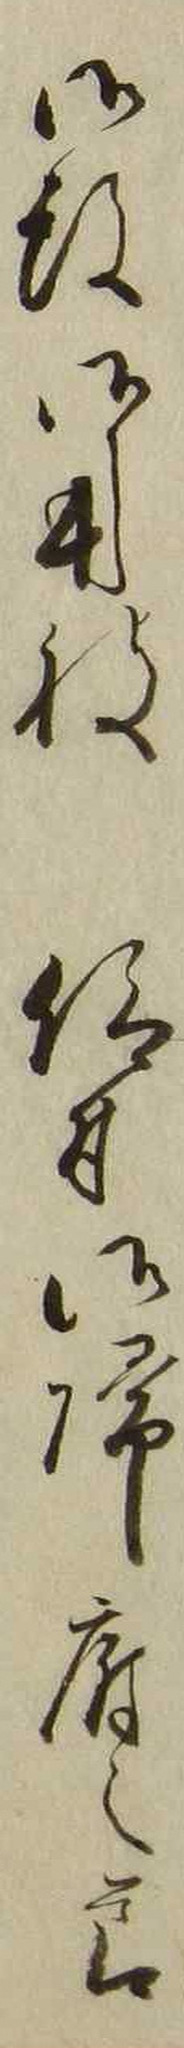御役御用被仰付御滞府之節
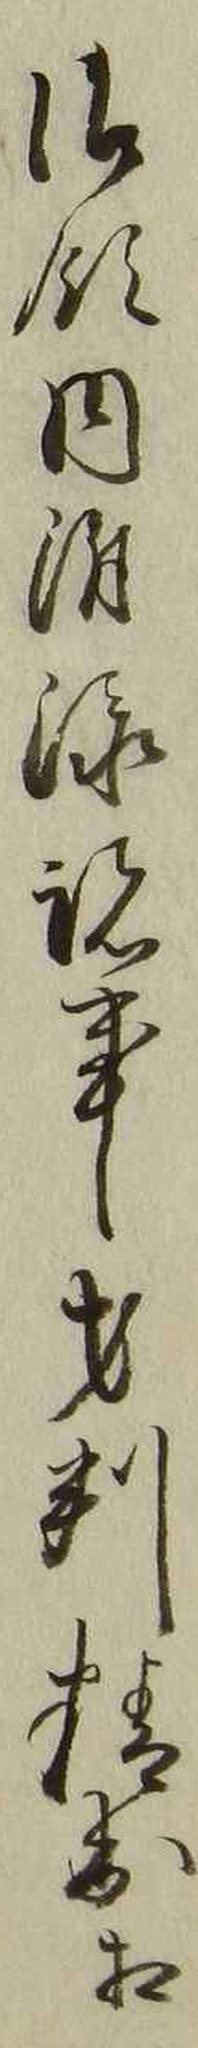御領内附添諸事才判精出相
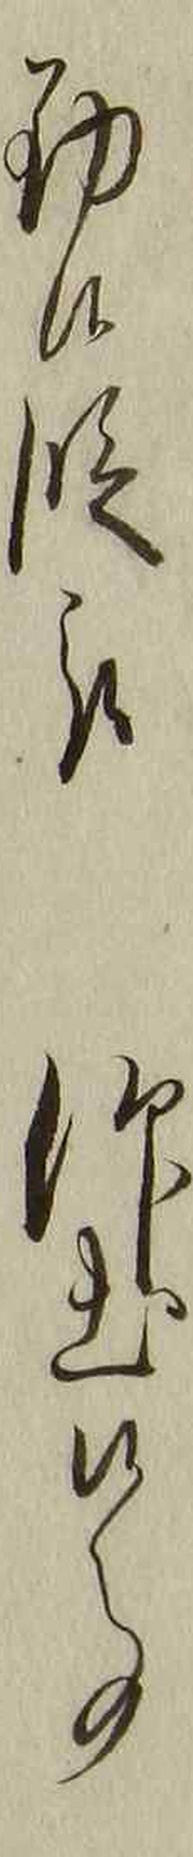勤候段被仰出候事
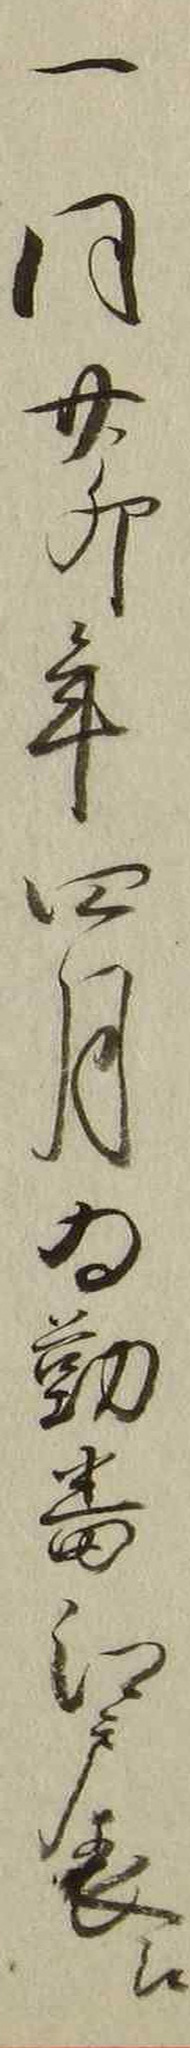一同廿卯年四月為勤番江戸表江
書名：諸士系譜　巻之2　い之部2
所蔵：会津若松市立会津図書館
